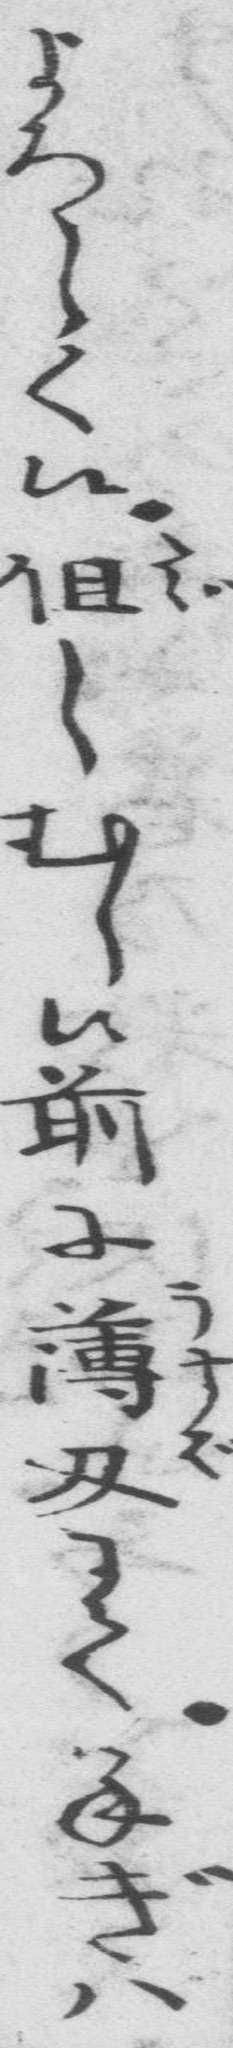よろしく候。但しむし候前に薄刃にて。手ぎは
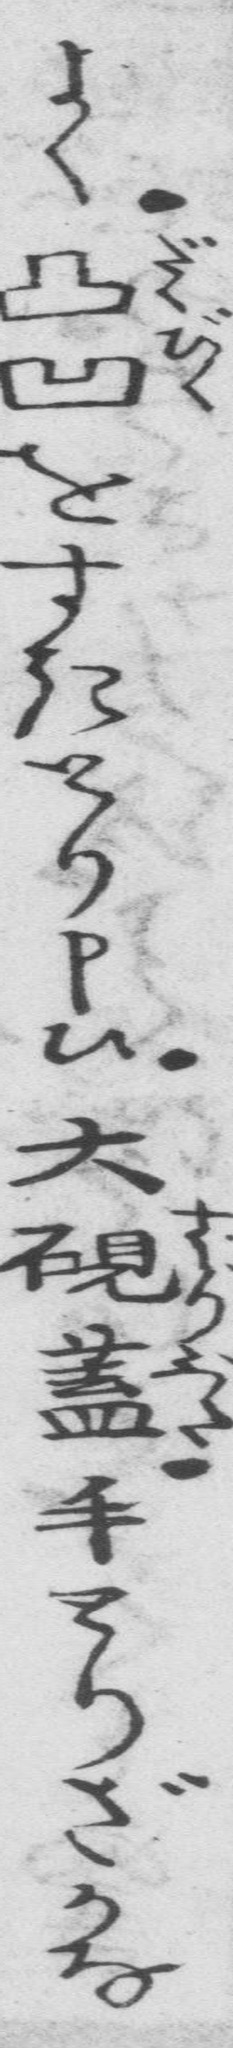よく凸凹をすきとり申候。大硯蓋。手とりざかな
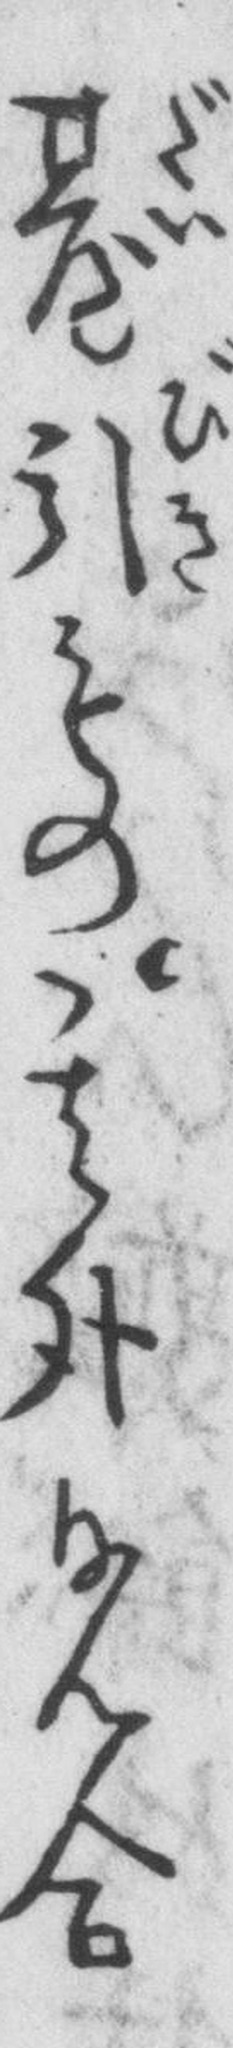台引もの。其外見合
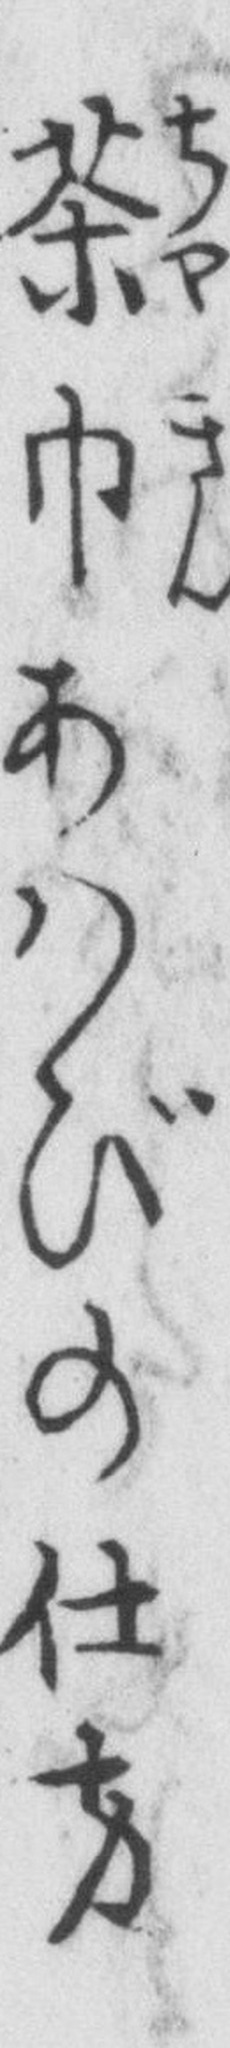茶巾あはびの仕方
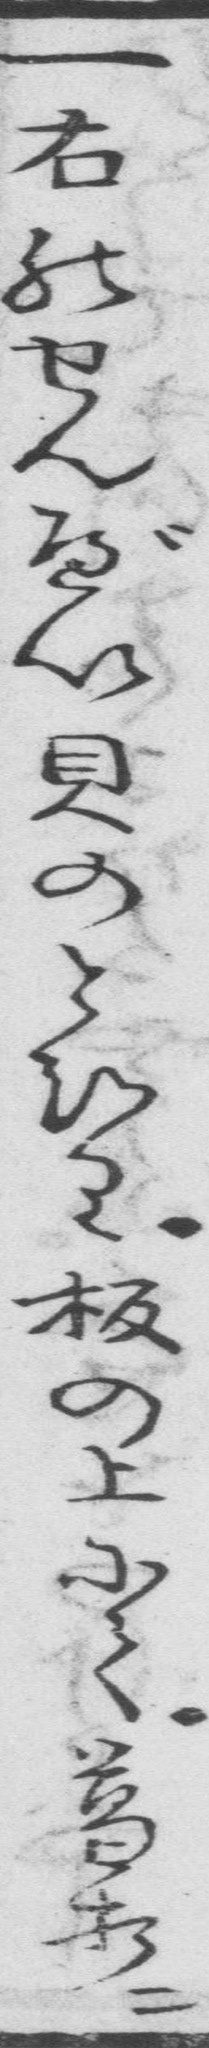一右のせんべい貝のとをり。板の上にて。葛打に
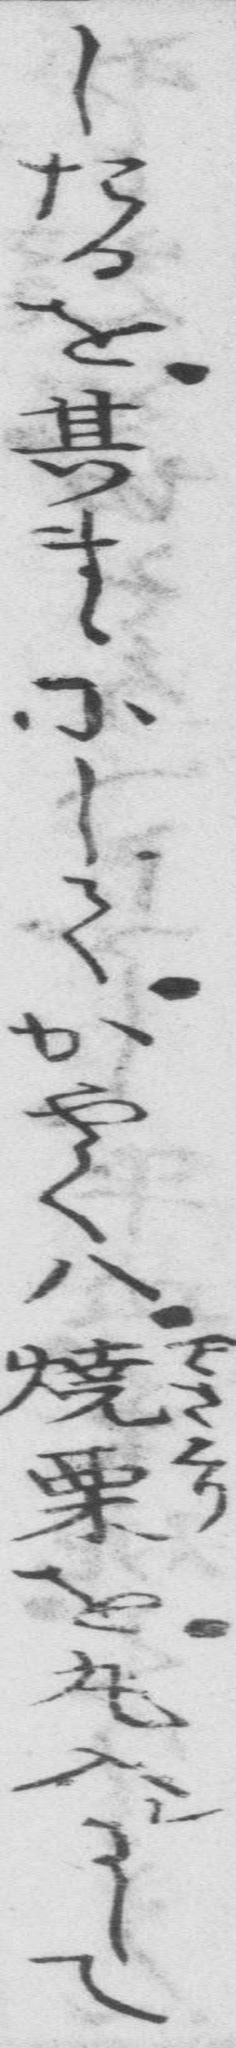したるを。其まゝにして。かやくは。焼栗を。丸入れにして
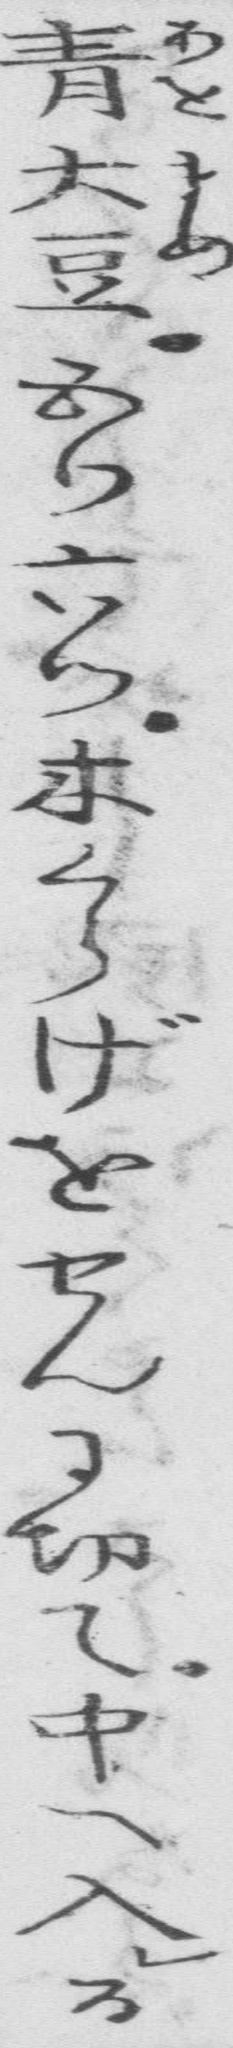青大豆。五ツ六ツ。木くらげをせんに切て。中へ入れる
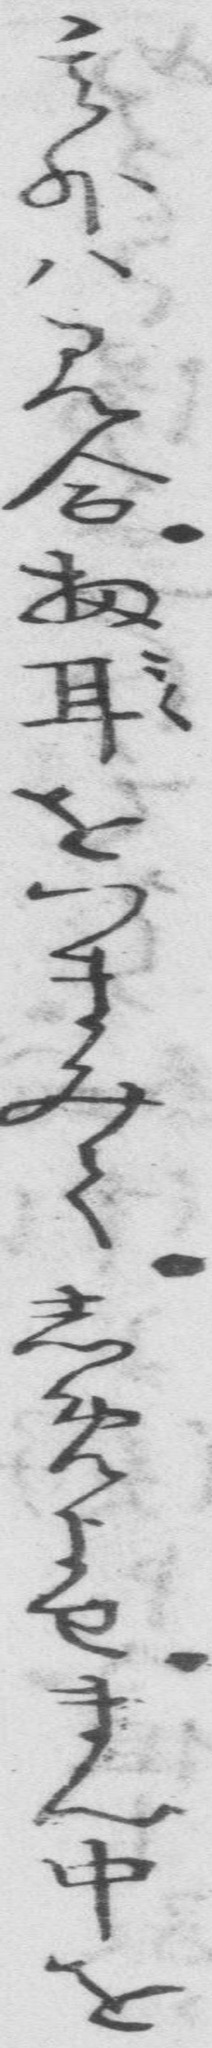其外は見合。扨耳をつまみて。しめよせ。まん中を
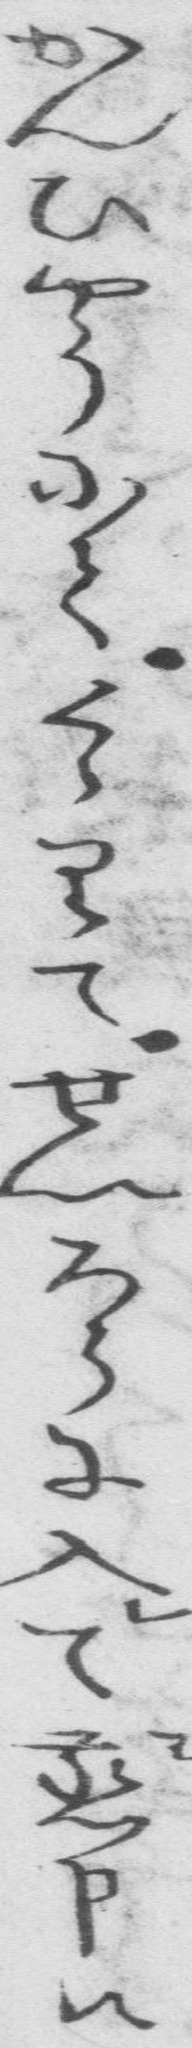かんひやうにて。くゝりて。せいろうに入れて蒸申候
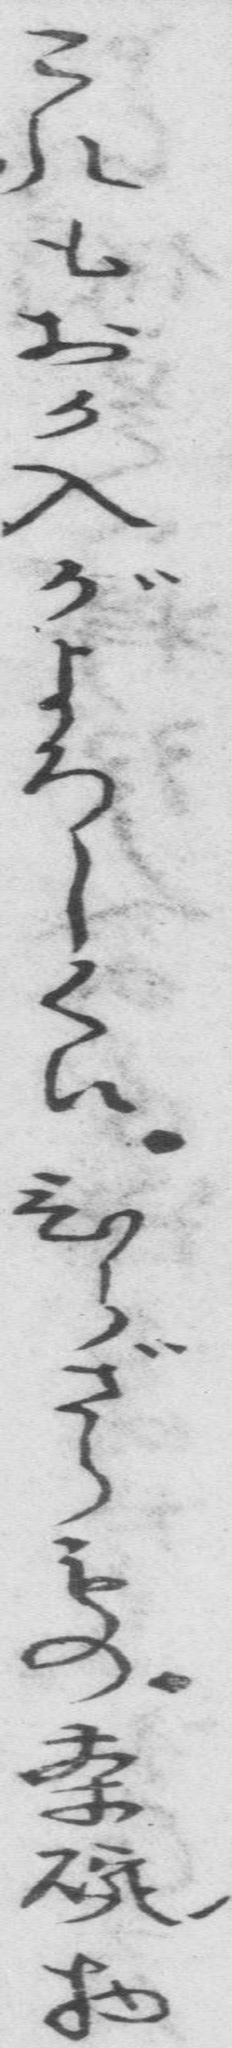これもおか入がよろしく候。ひらざらもの。茶碗物
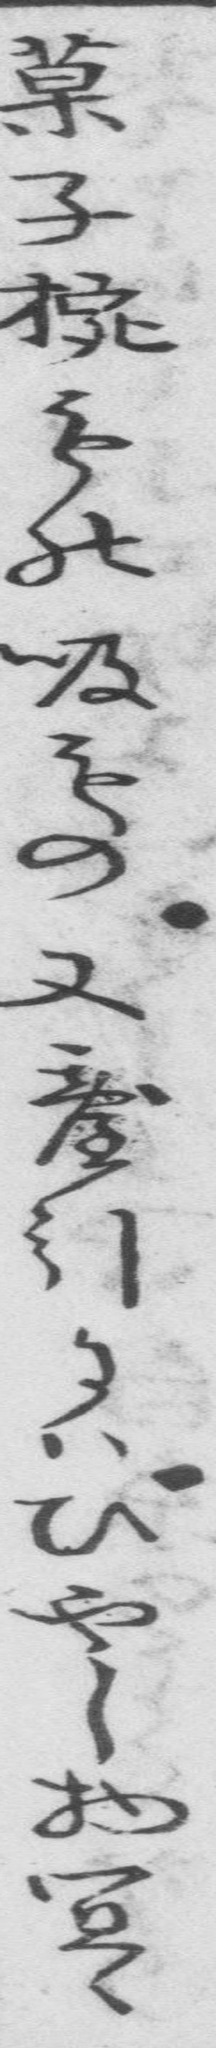菓子椀もの吸もの。又台引には。ひやし物宜く
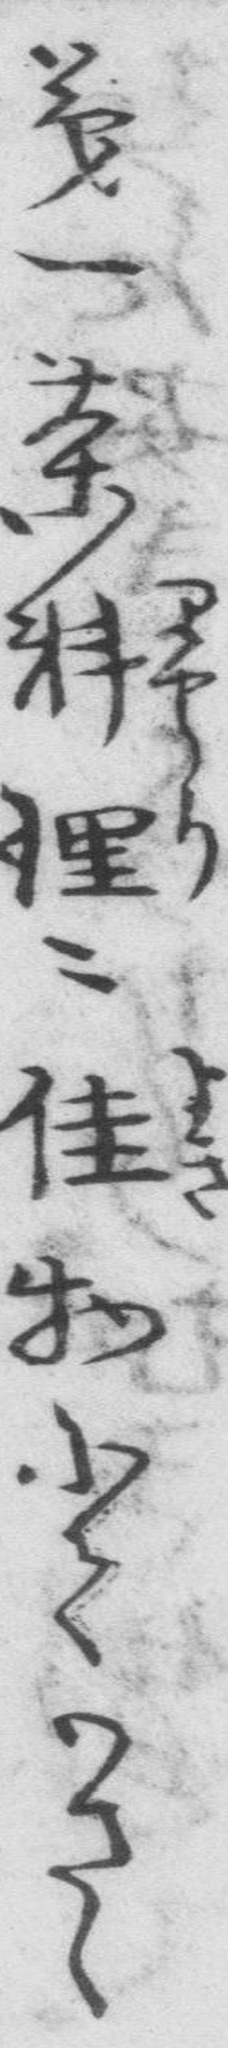第一茶料理に佳物にて御さ候
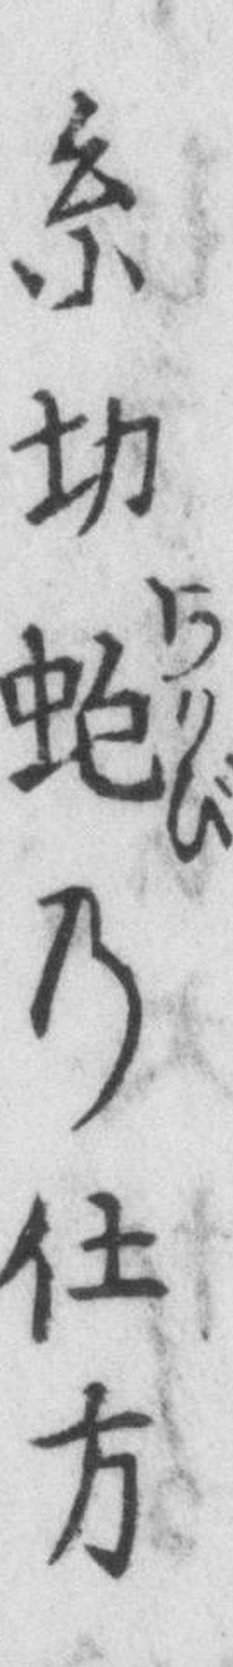糸切鮑の仕方
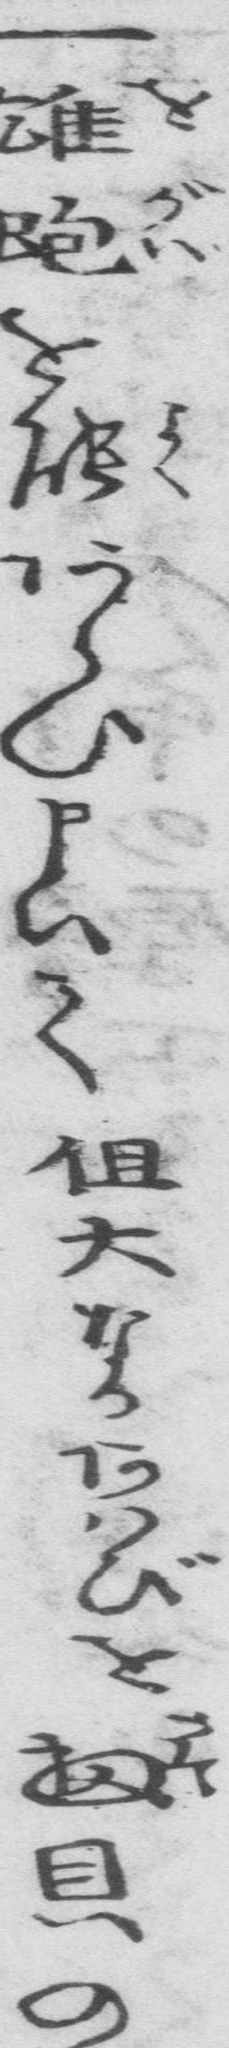一雄鮑を能あらひ申候て但大なるあはびを扨貝の

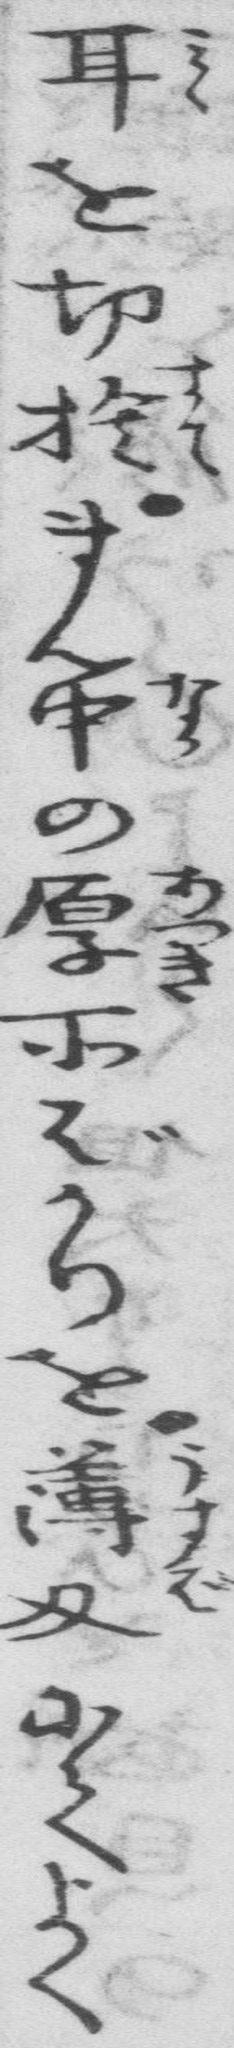耳を切捨。まん中の厚所ばかりを。薄刃にてよく
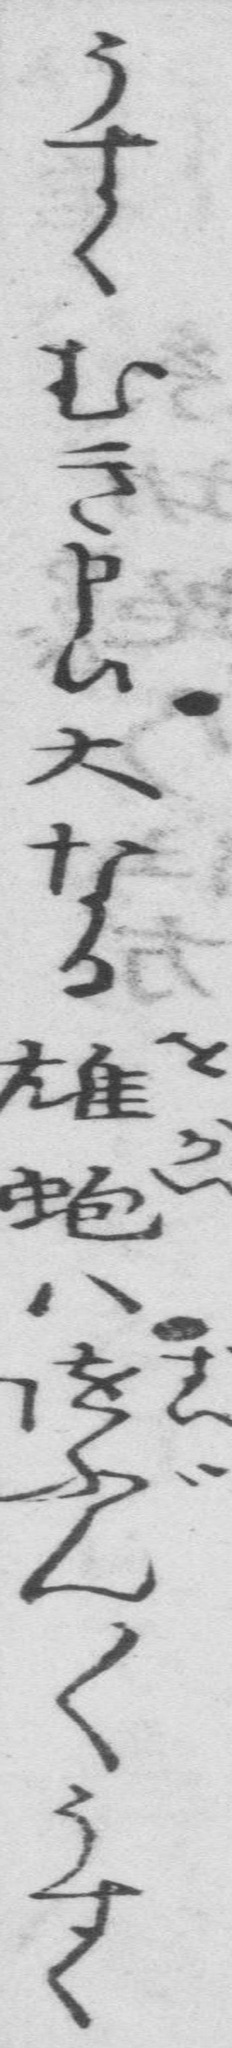うすくむき申候。大なる雄鮑は。随ぶん〳〵うすく
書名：萬寳料理秘密箱
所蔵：大阪府立大学学術情報センター 国文学研究資料館
